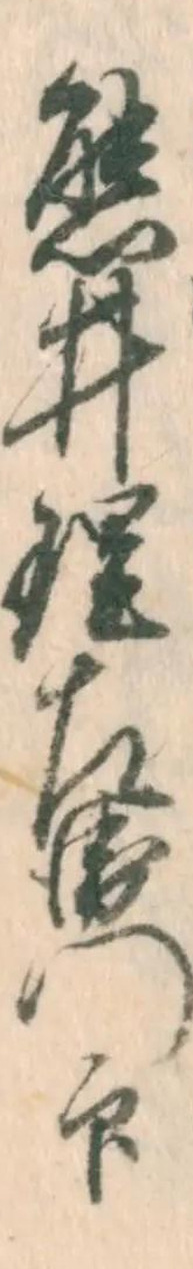熊井理左衛門印
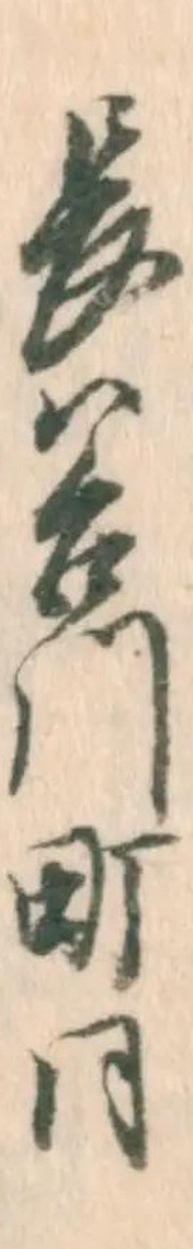長谷川町同
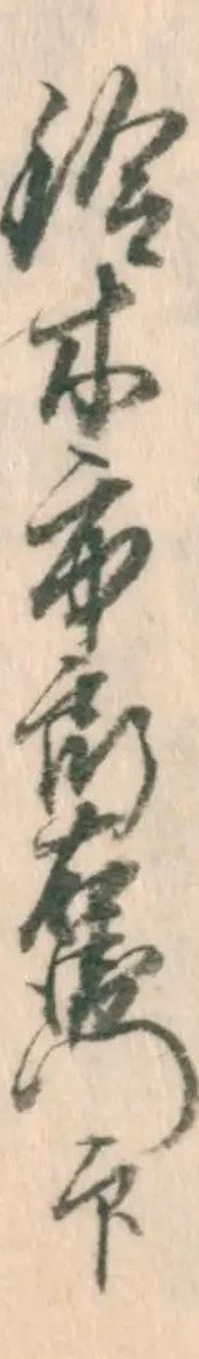鈴木市郎右衛門印
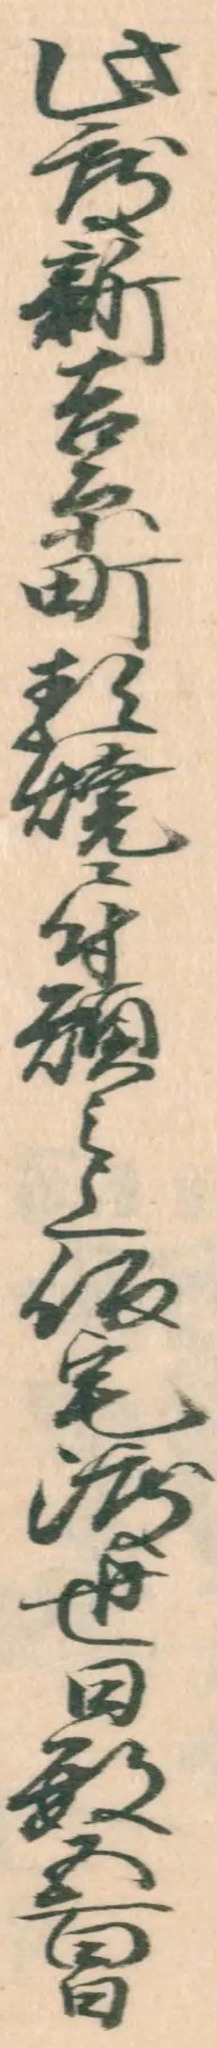此度新吉原町類焼ニ付願之上仮宅渡世日数五百日
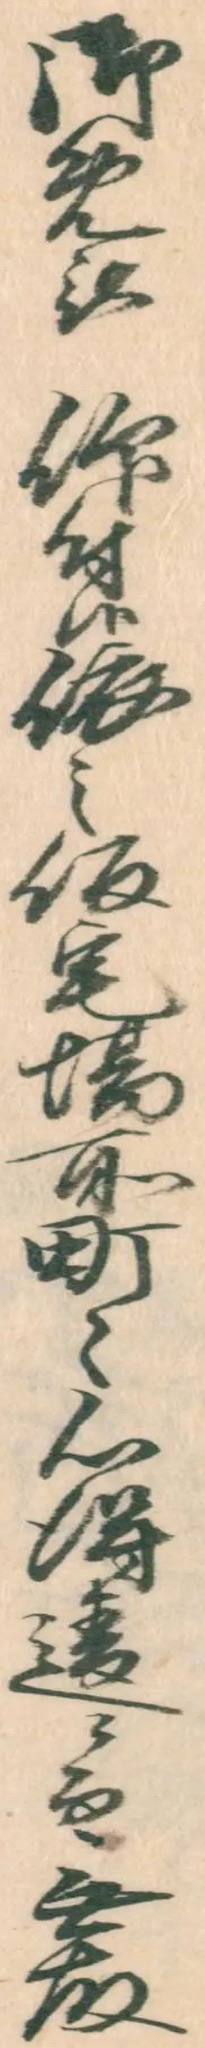御免被仰付候依之仮宅場所町〻心得違ニて無故
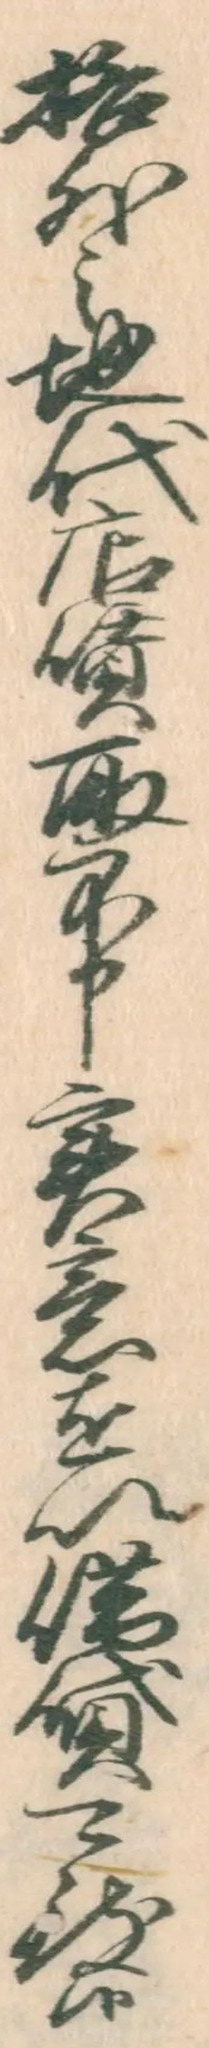格外之地代店賃取不申実意を以借貸可候致
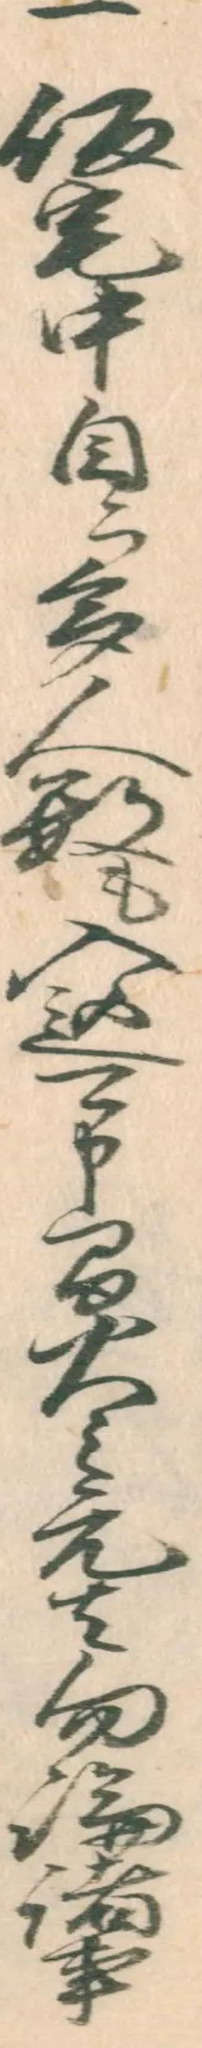一仮宅中自ら多人数も入込可申間火之元は勿論諸事
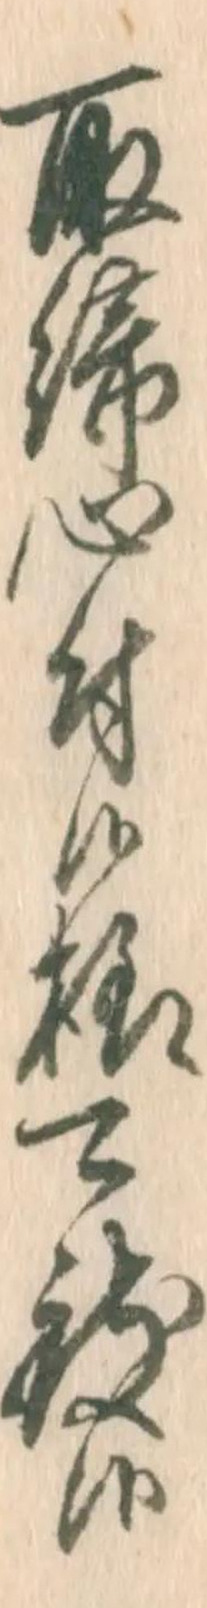取締心付候様可致候
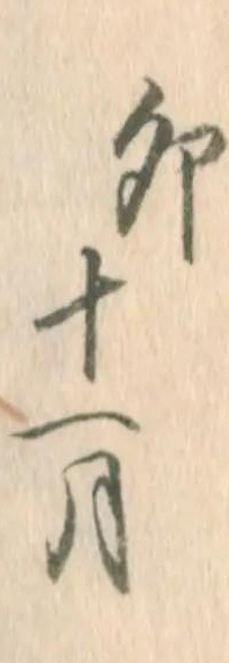卯十一月

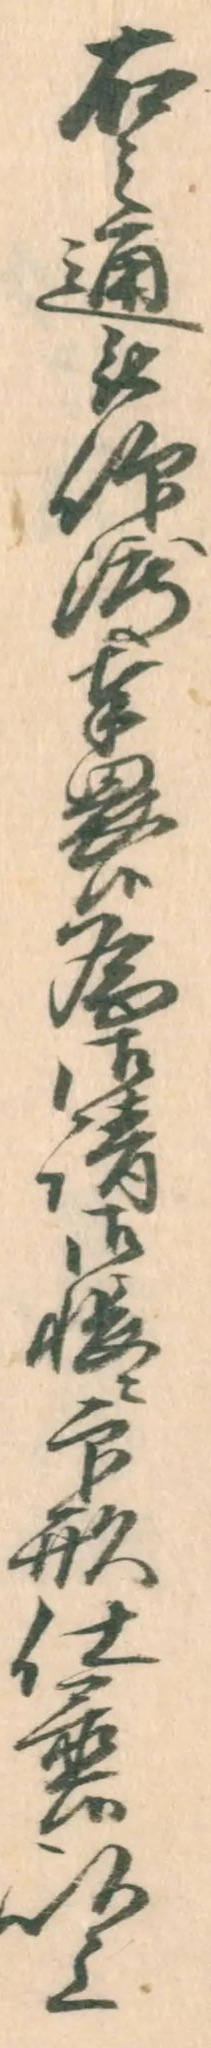右之通被仰渡奉畏候為御請御帳ニ印形仕置候以上
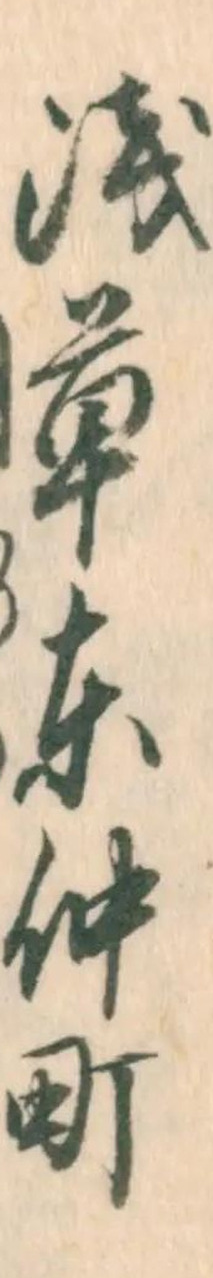浅草東仲町
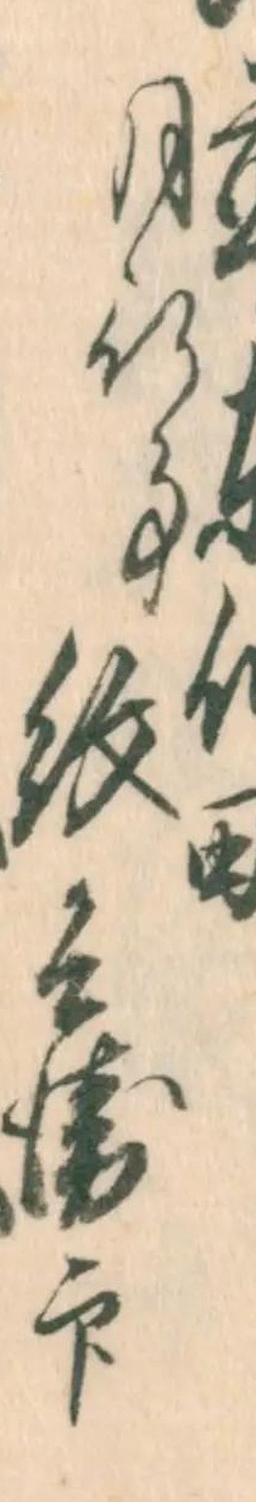月行事平兵衛印
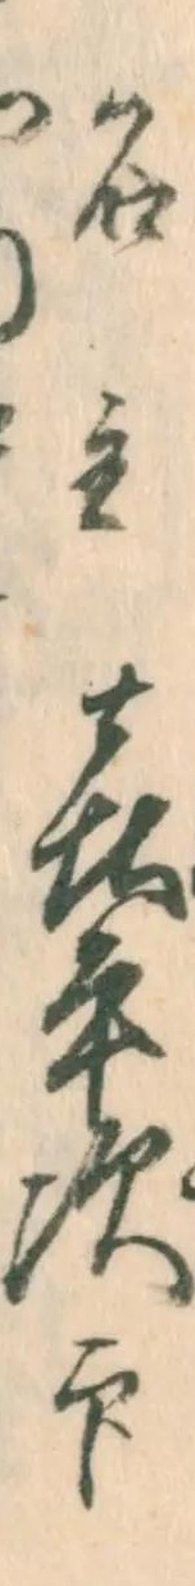名主喜平次印
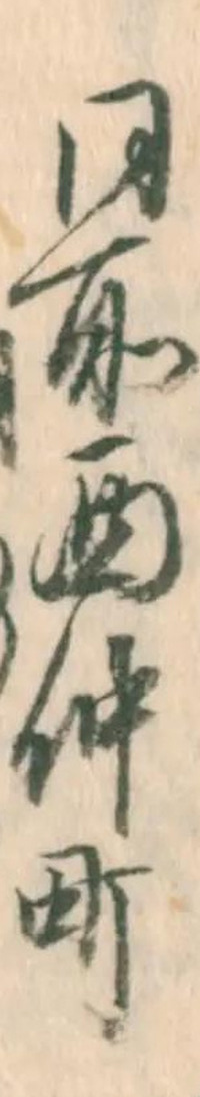同所西仲町
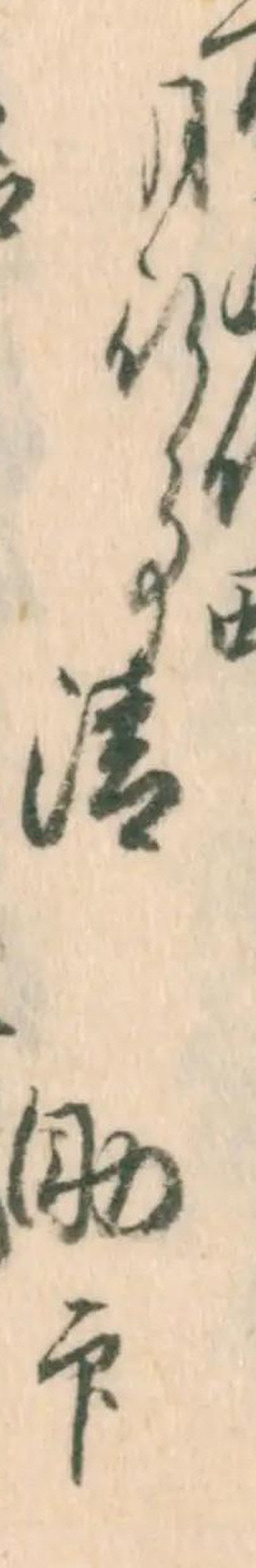月行事清助印
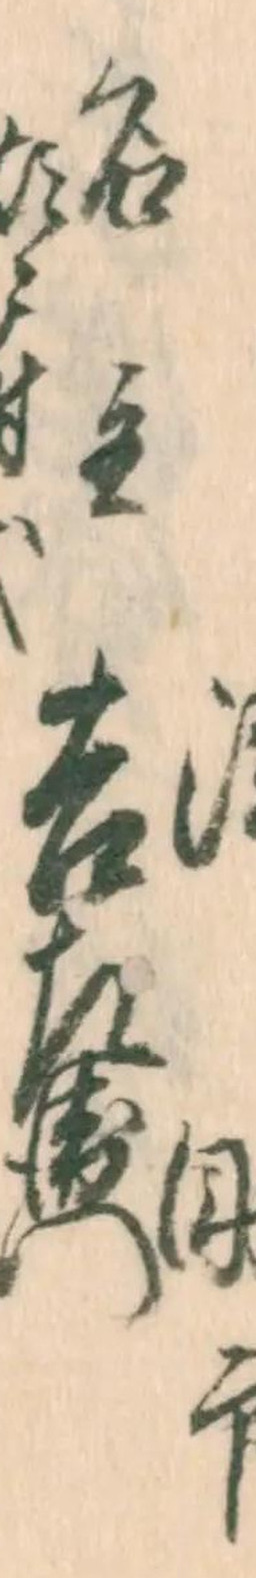名主吉左衛門
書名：地震災書留 2巻. [2] 内表紙に「地震一件　安政二卯年十月」とあり
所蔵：国立国会図書館 National Diet Library, JAPAN
